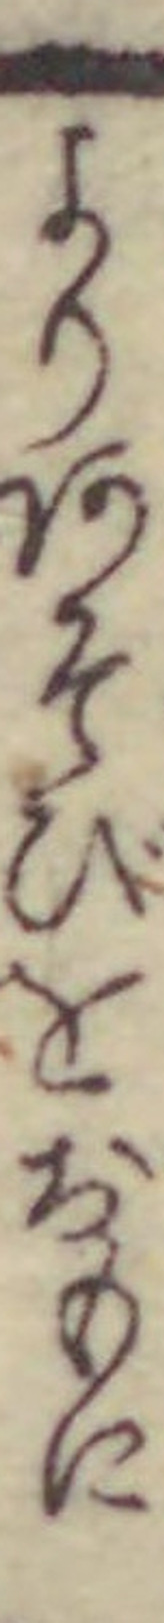よりあそびをおもに
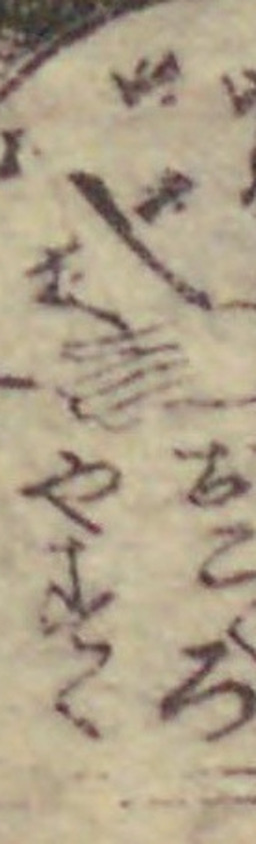やすく
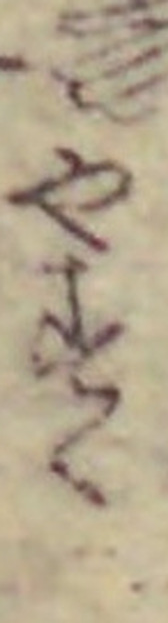やすく
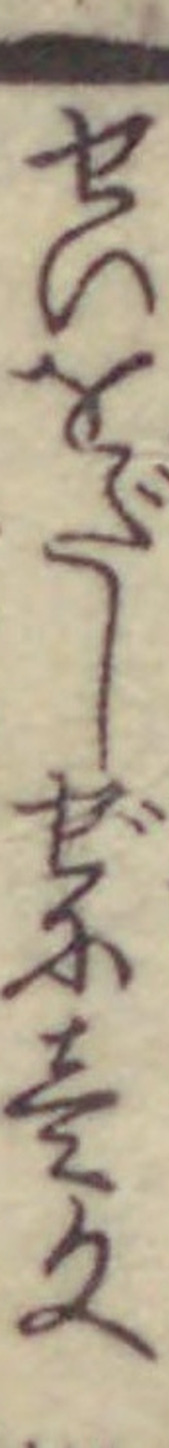せいをだしぜに壱文
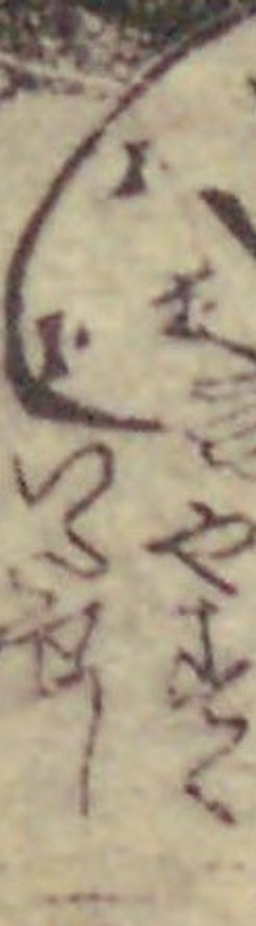いたせし
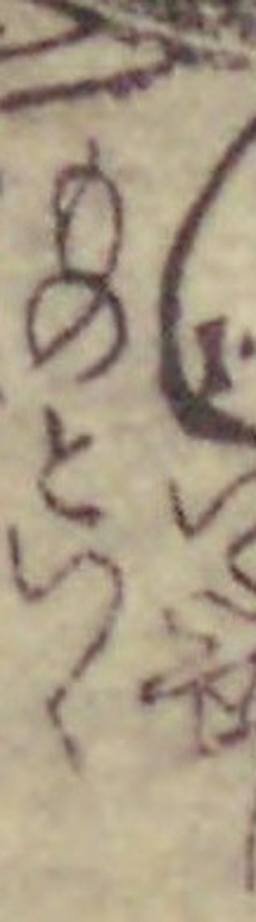ものといゝ
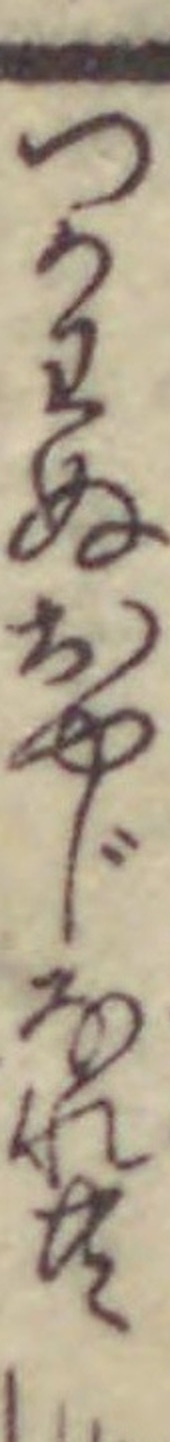つかわぬおやじなれ共
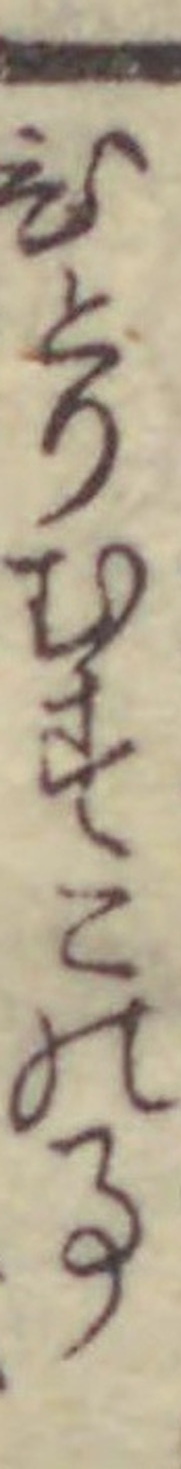ひとりむすこの事
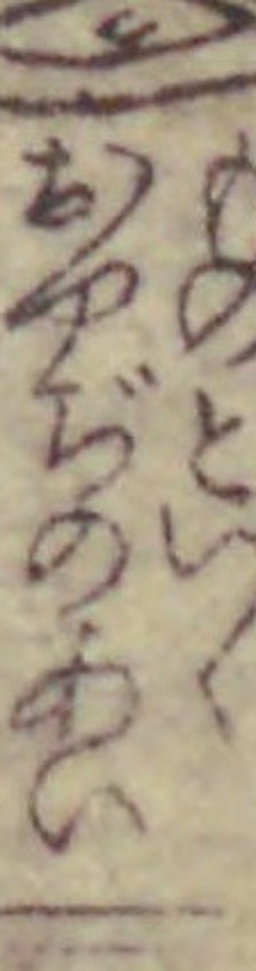おやぢのあい
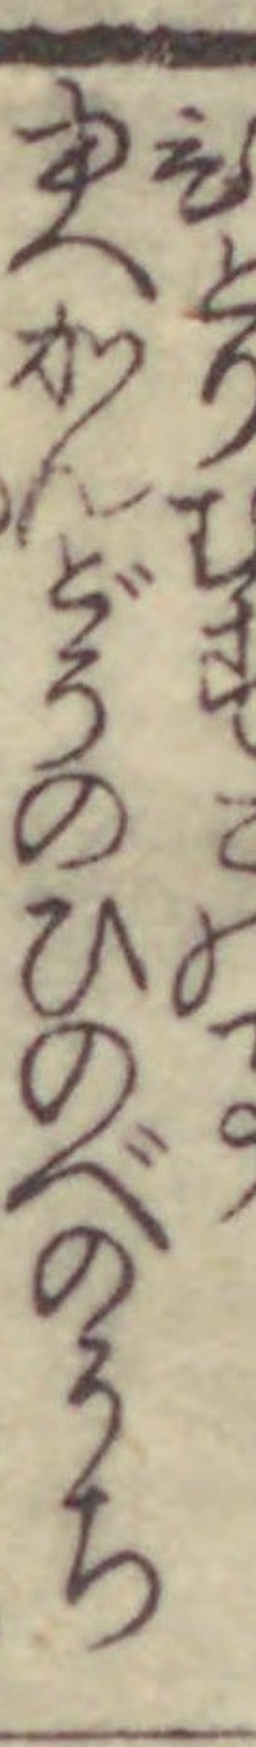ゆへかんどうのひのべのうち
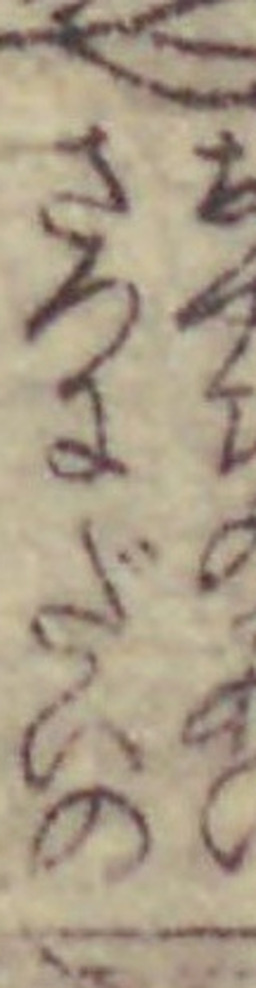さつにだいの
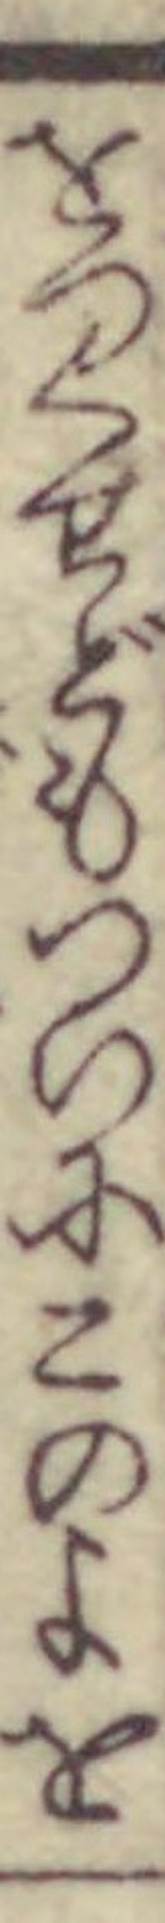をつくせどもついにこのよを
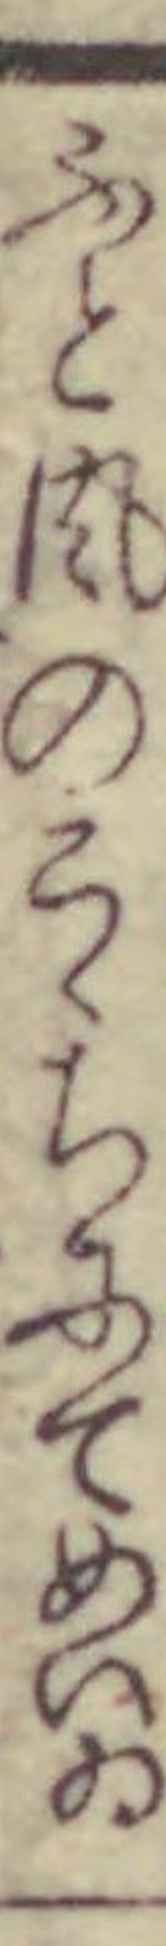ふと風のこゝちにてめいゐ
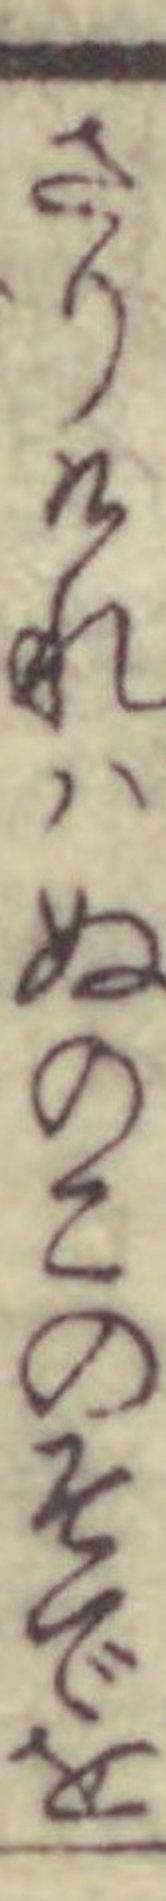さりければぬのこのそでを
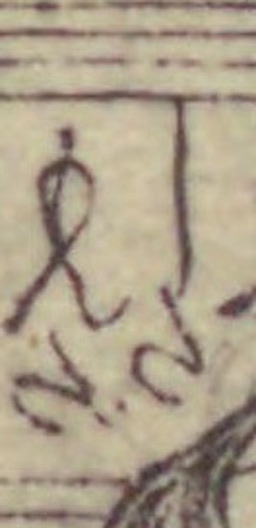もんだ
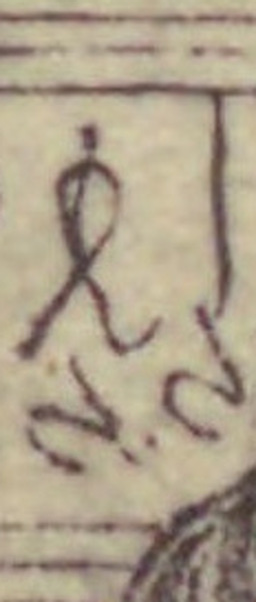もんだ
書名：大通人穴[サガシ] 3巻
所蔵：国立国会図書館 National Diet Library, JAPAN
